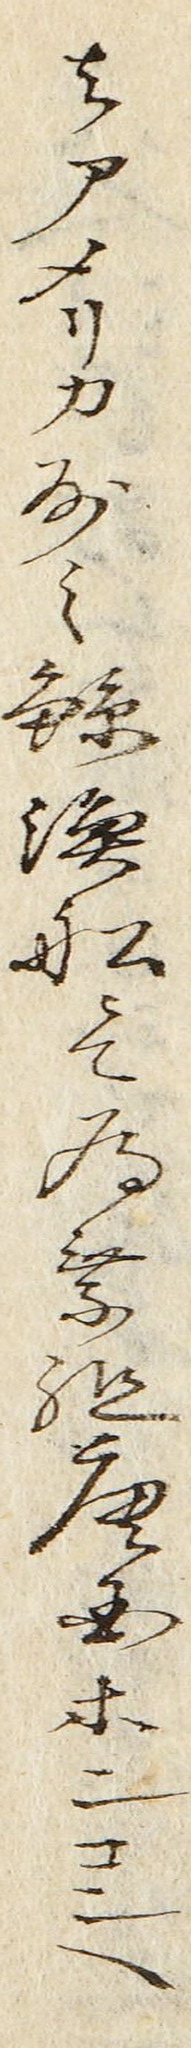はアメリカ州之鯨漁船にて為乗組唐国ホンコンへ
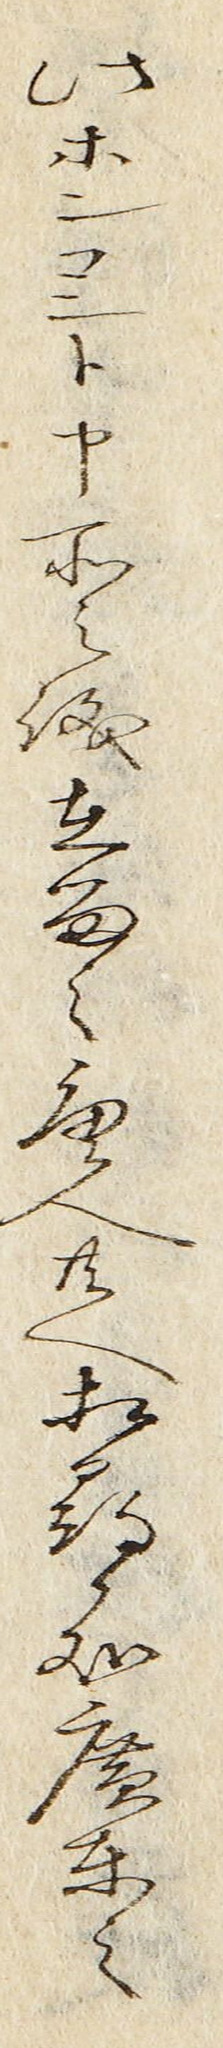此ホンコント申所之儀在留の唐人共へ相尋候処広東之
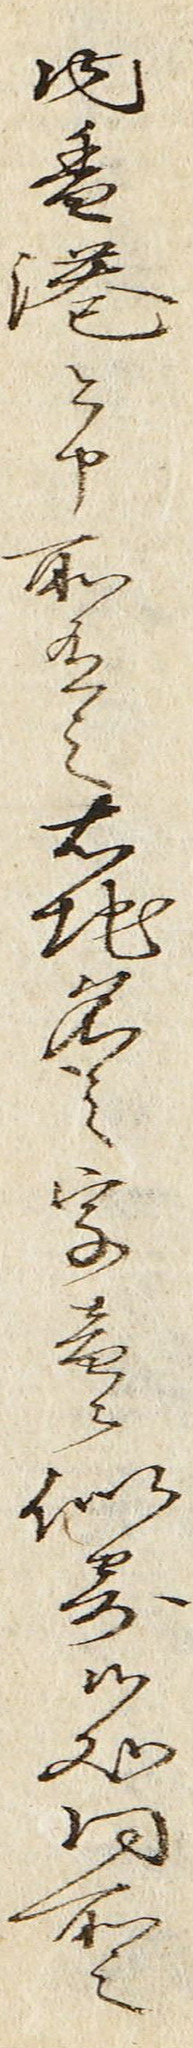内香港と申所有之右地名之字音に似寄候処同所之
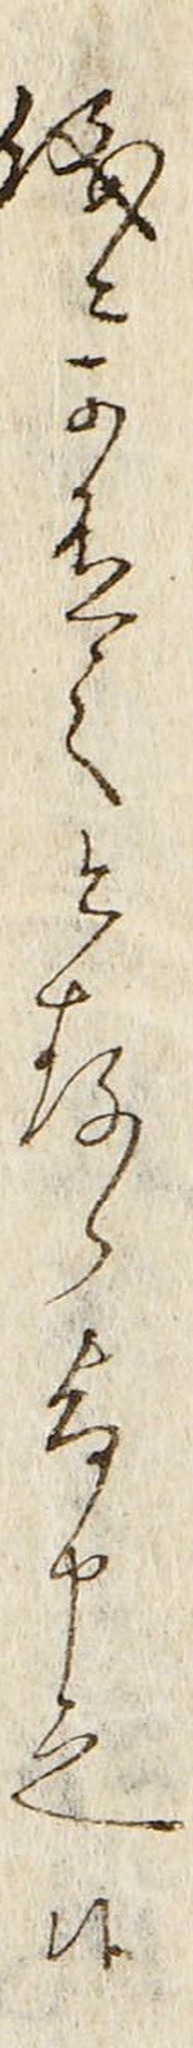儀に可有之と存候旨申之候
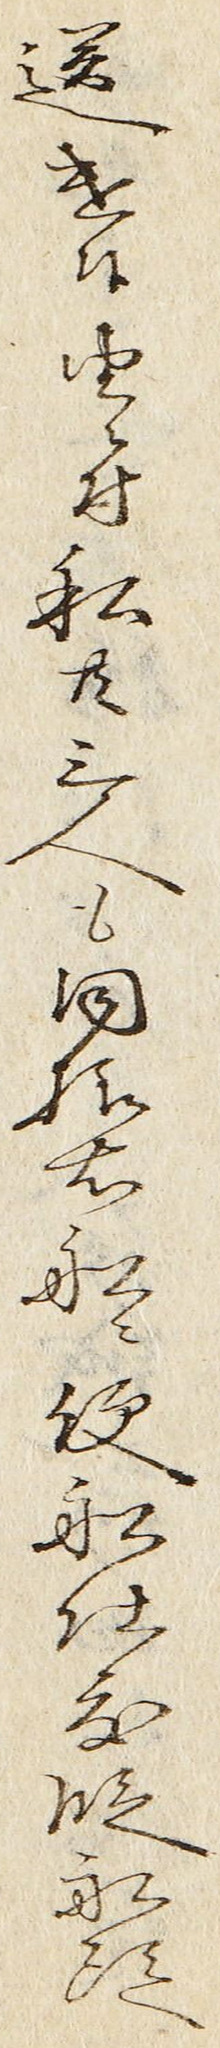送遣候由に付私共三人も同様右船に便船仕度段船頭へ
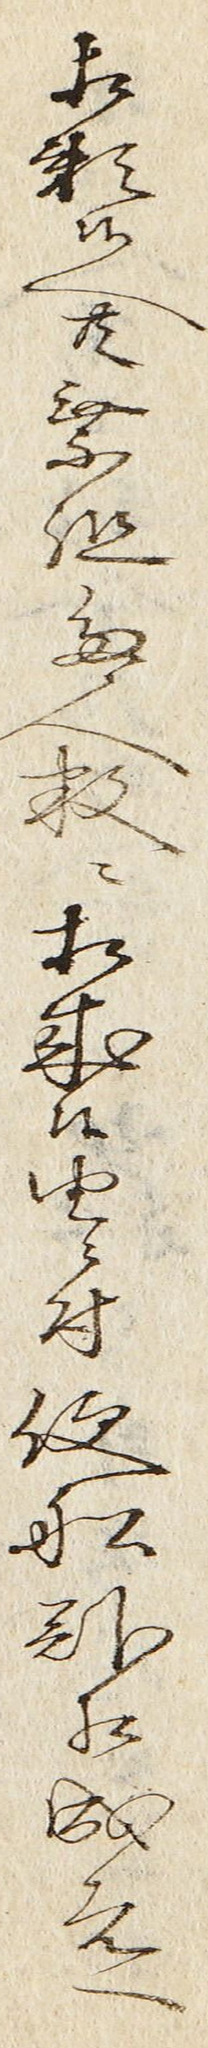相頼候へ共乗組多人数に相成候由に付便船難相成へ
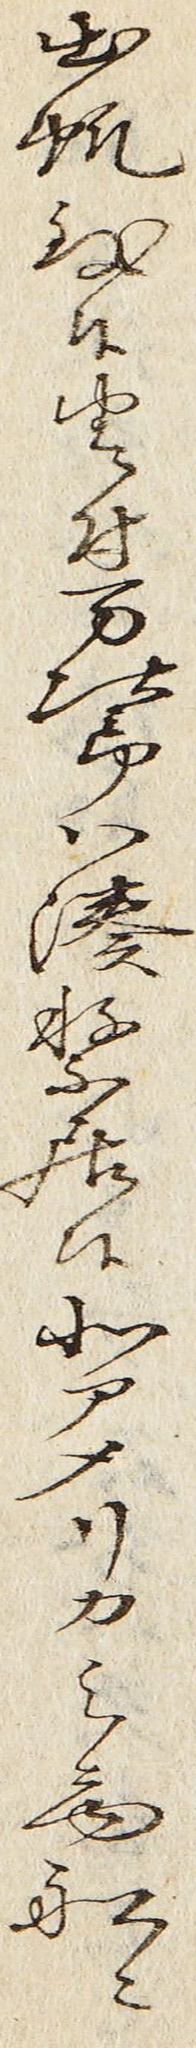出帆致候由に付万次郎は湊繋居候北アメリカ之商船に
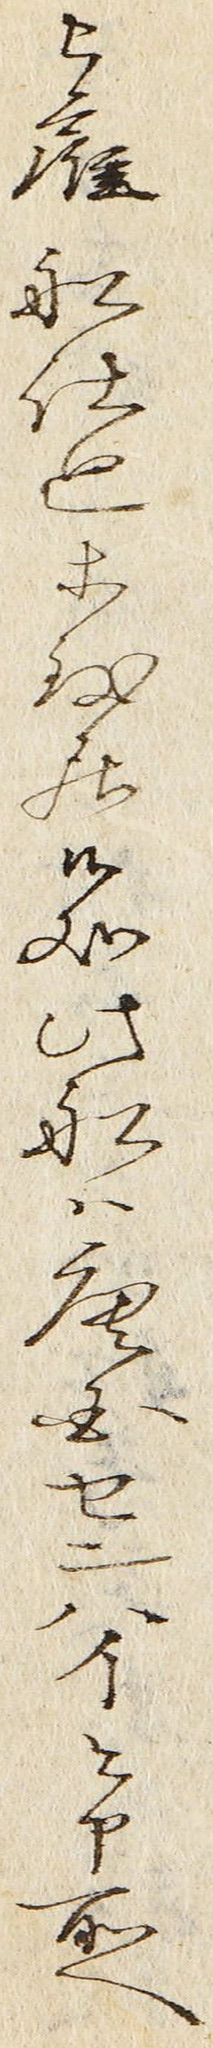被雇船仕廻等致居候処此船は唐国センハイと申所へ
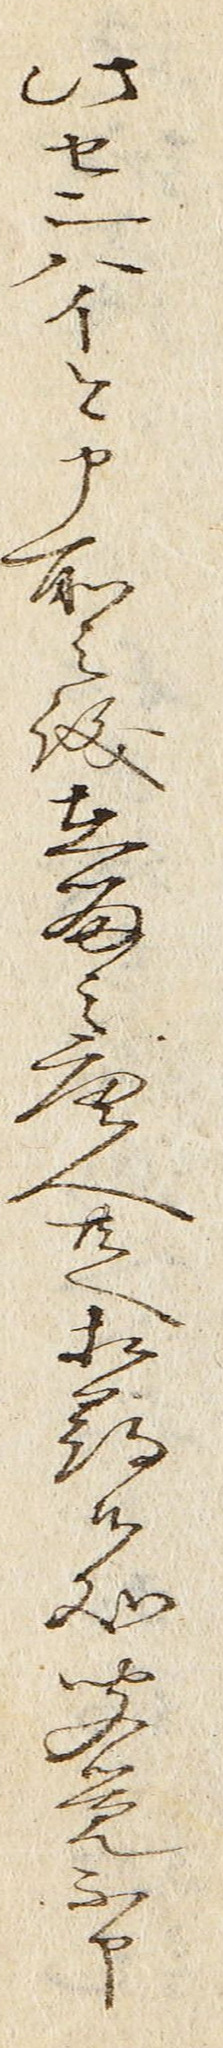此センハイと申所之儀在留之唐人共へ相尋候処聞覚不申
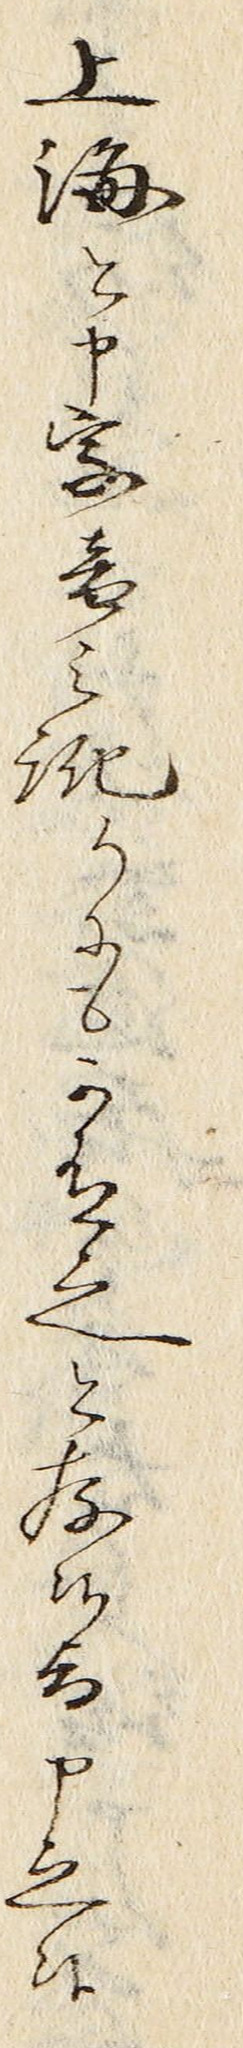上海と申字音之訛りにも可有之と存候旨申之候
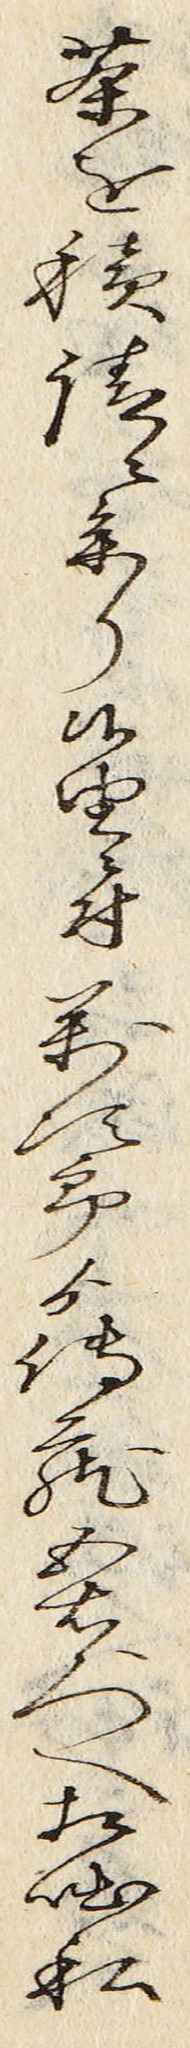茶を積受請に参り候由に付万次郎ゟ伝蔵五右衛門へ相咄私
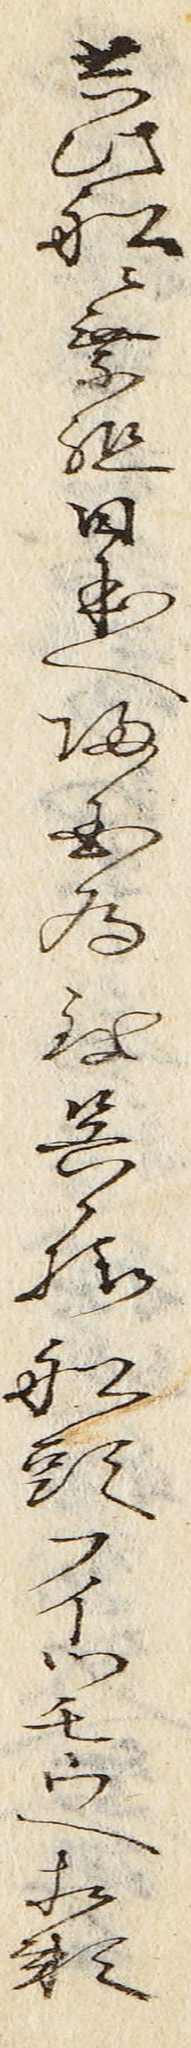共此船に乗組日本へ帰国為致呉候様船頭フイツモウへ相頼
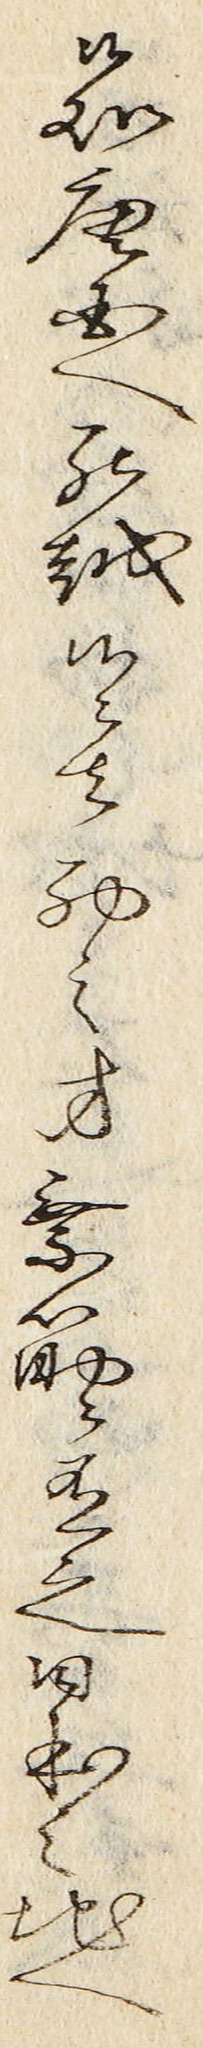候処唐国へ罷越候には西之方乗筋に有之日本之地へ
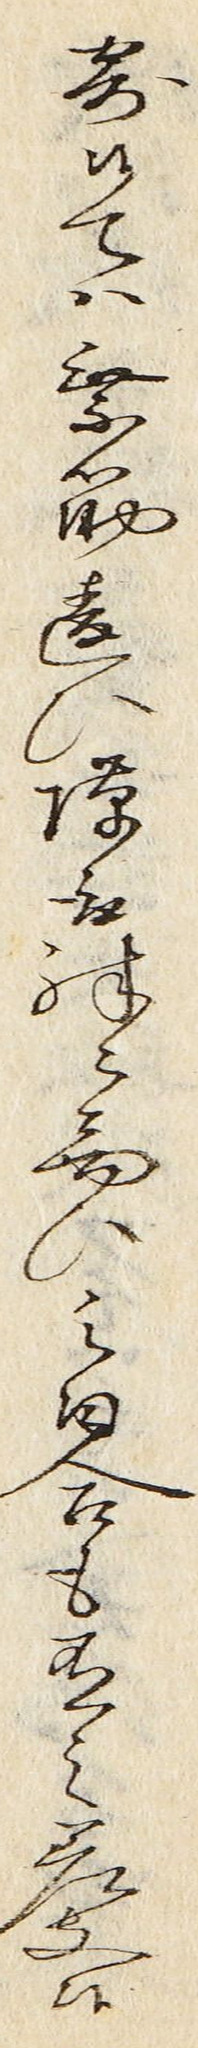寄候ては乗筋違ひ隙取殊に商ひ之日合も有之差支候
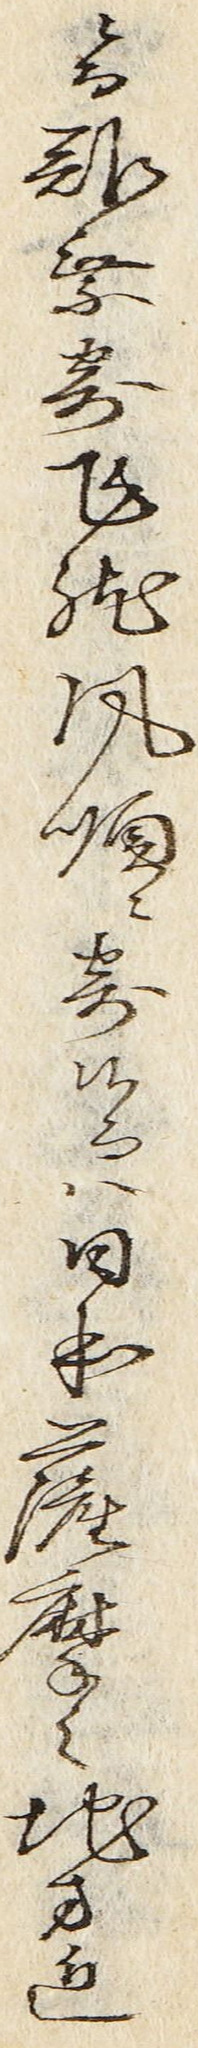に而難乗寄席乍然風順に寄候而は日本薩摩之地方近
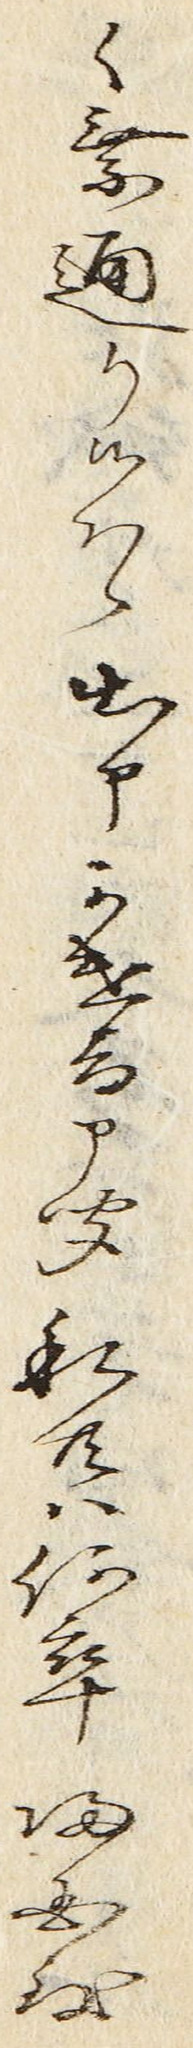く乗通り候はゝ出申可遣旨申聞私共は何卒帰国致
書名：土佐中浜万次郎漂流記
